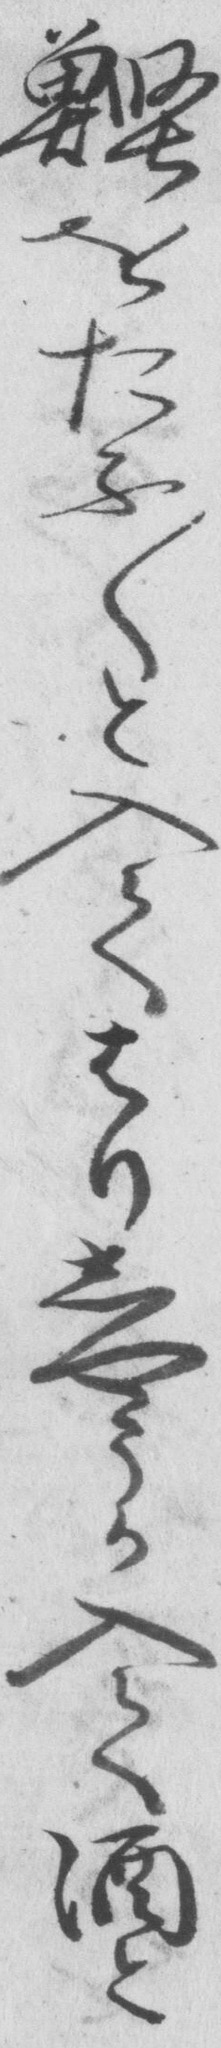鰹をたふ〳〵と入てはりしやうか入て酒と
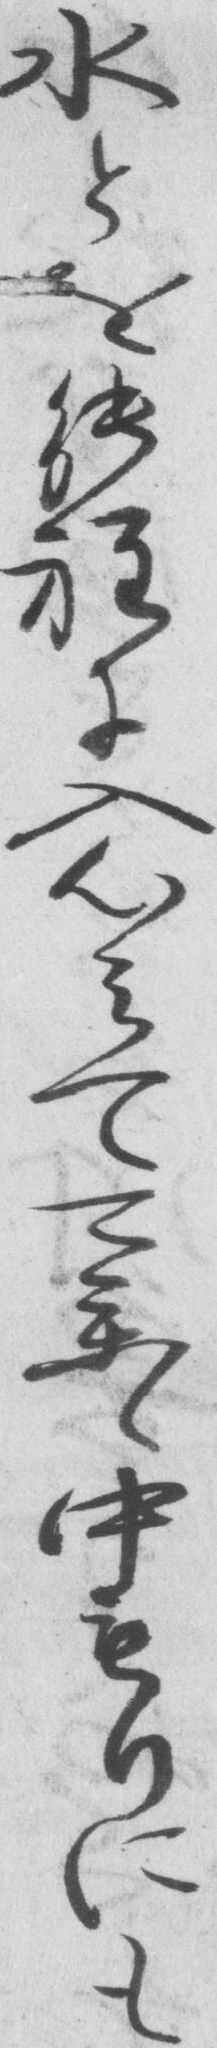水とを能程に入心みて可参候中もりにも
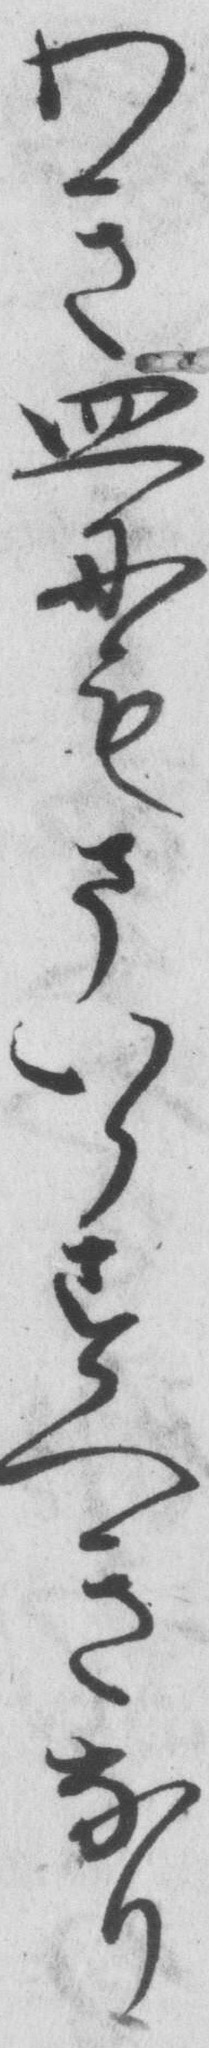わき皿にもまいらすへきなり
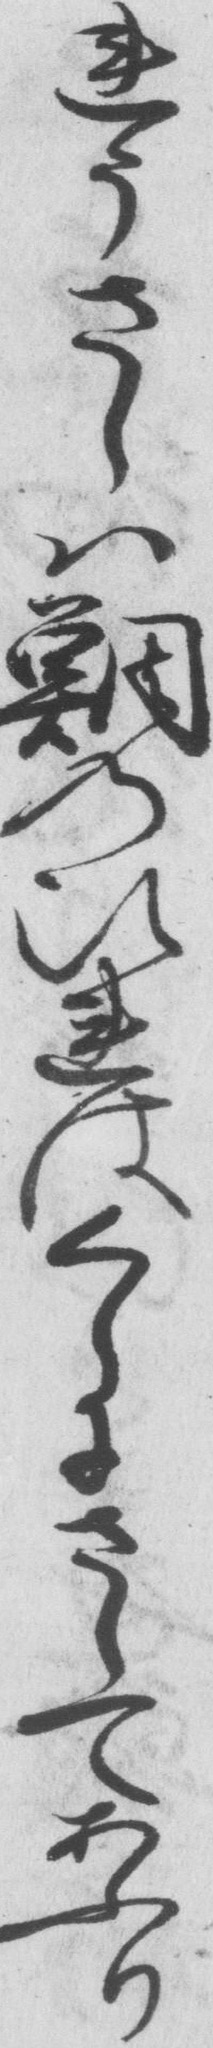一○れうさしは鯛のひれはくしにさしてあふり
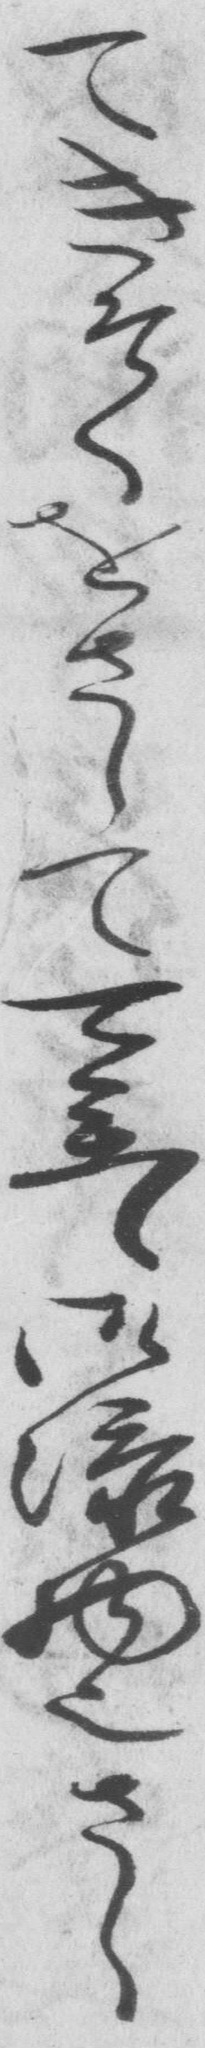てきそくをさして可参候御添物也さく
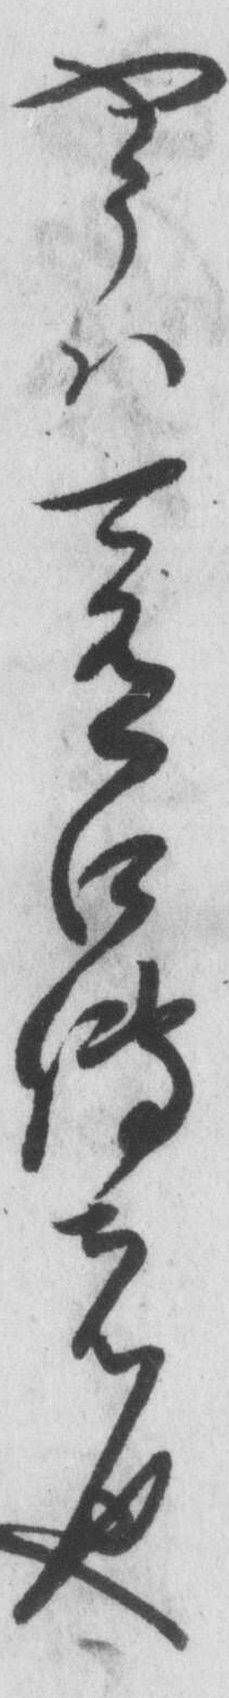やうは可有口伝者也
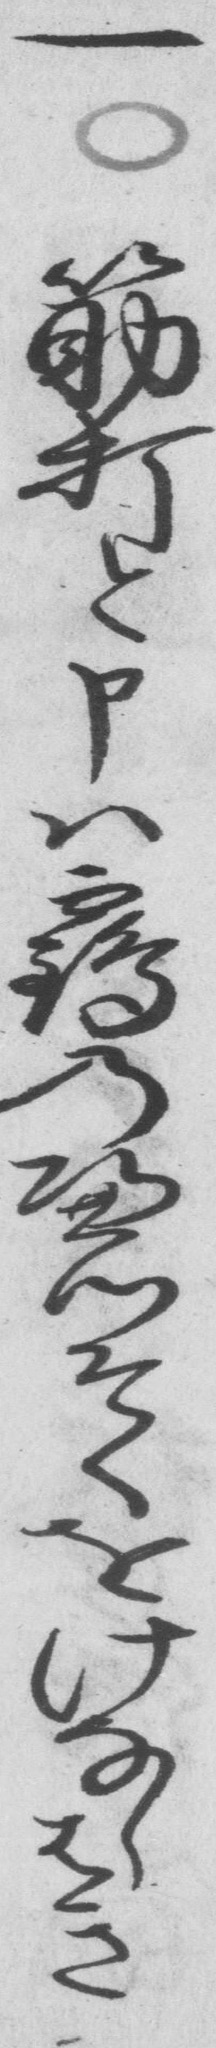一○筋打と申は鶴のへつそくをけなしはき
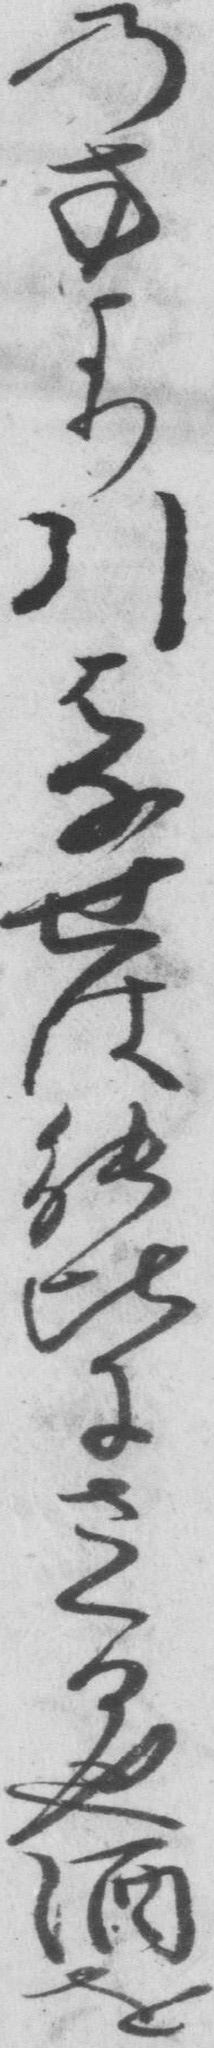の方より引はなせは能比にさくる也酒を
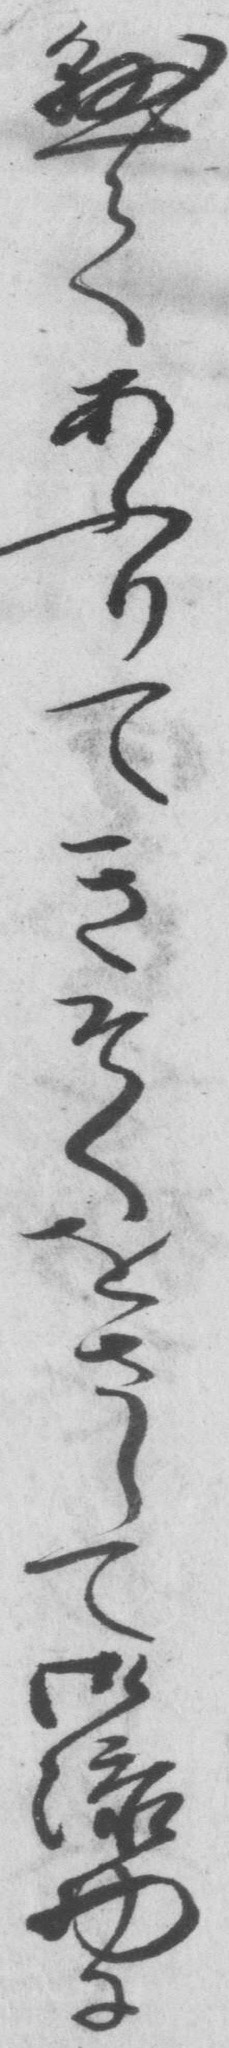懸てあふりてきそくをさして御添物に
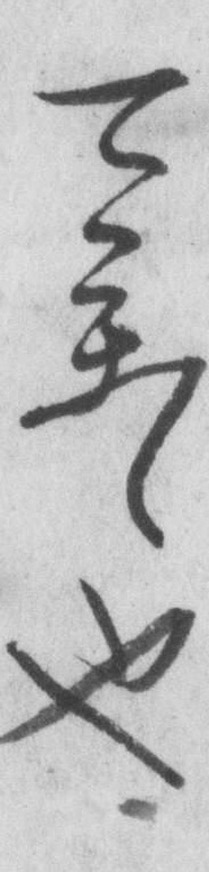可参候也
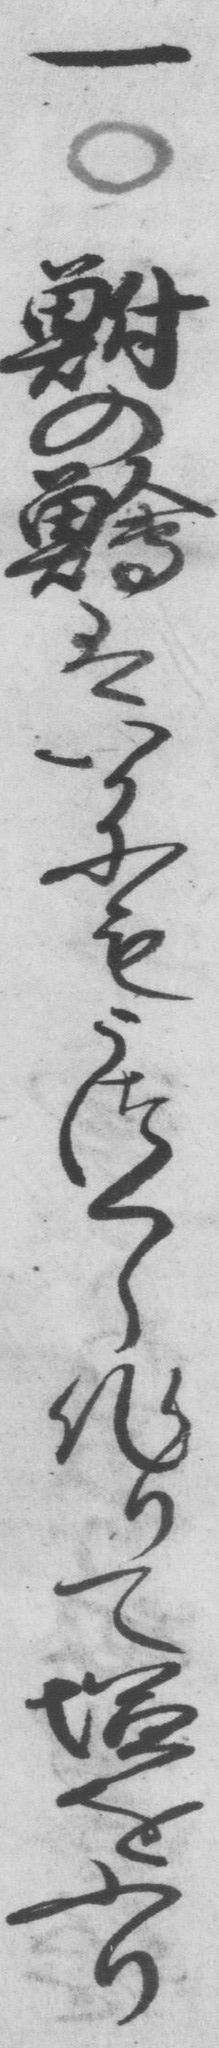一○鮒の鱠はいかにもうつくし作りて塩をふり

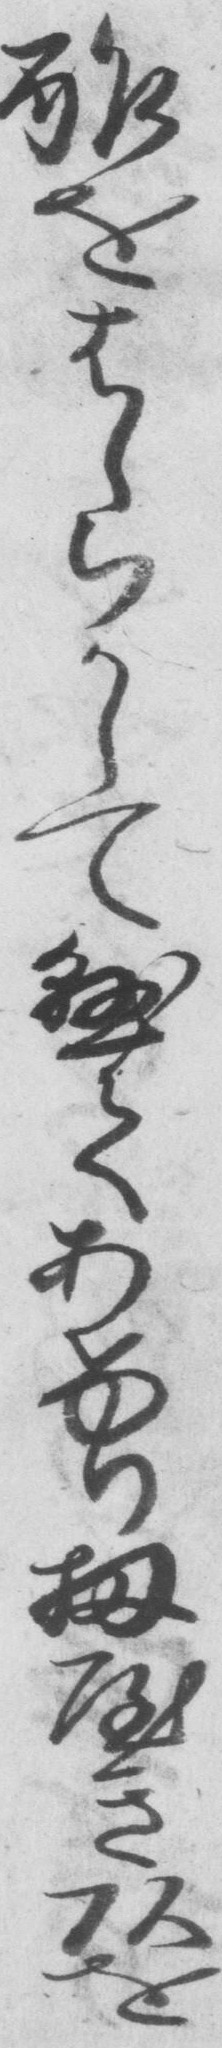酢をはしらかして懸てあけり扨やき頭を
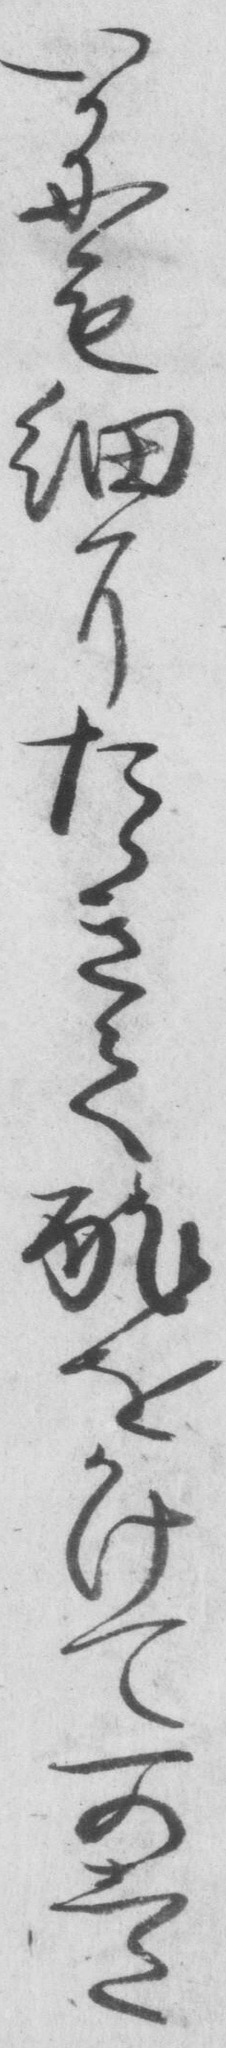いかにも細にたゝきて酢をかけてかた
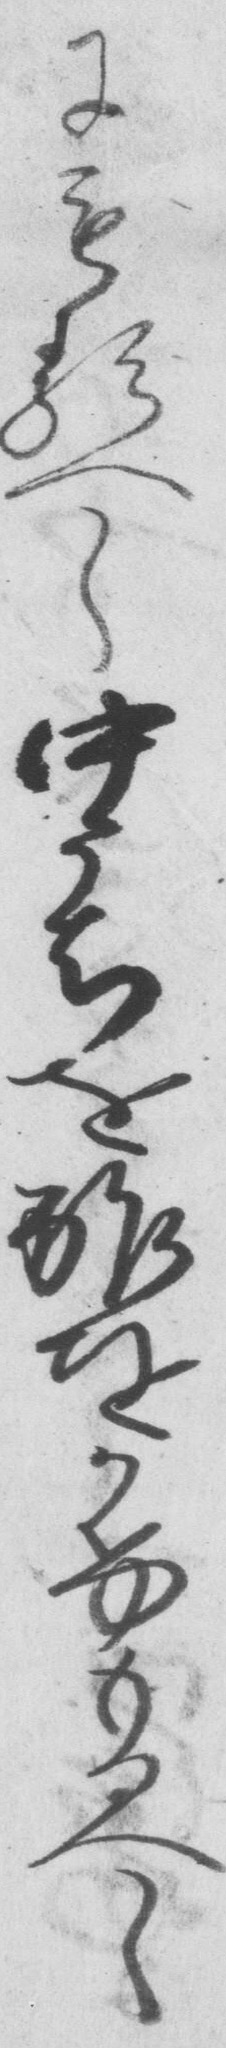にもるへし中うちを酢をかけもるへし
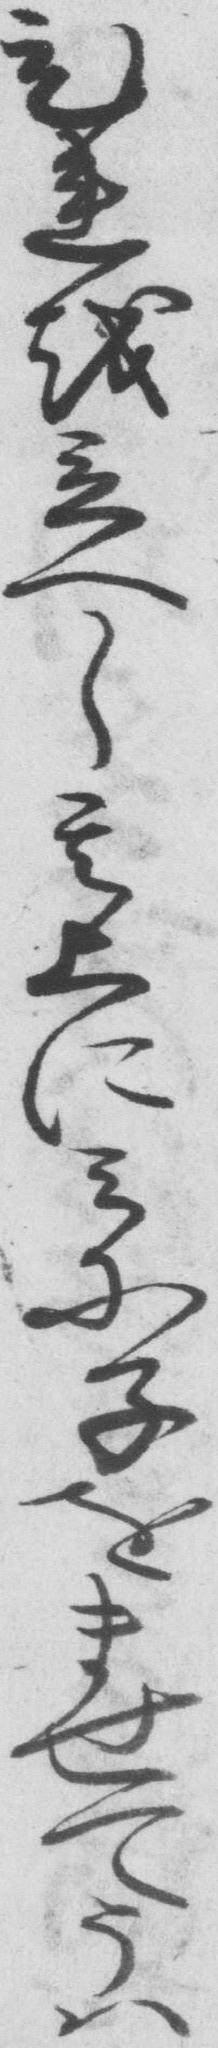ひれを立へし其上にみに子をませてうは
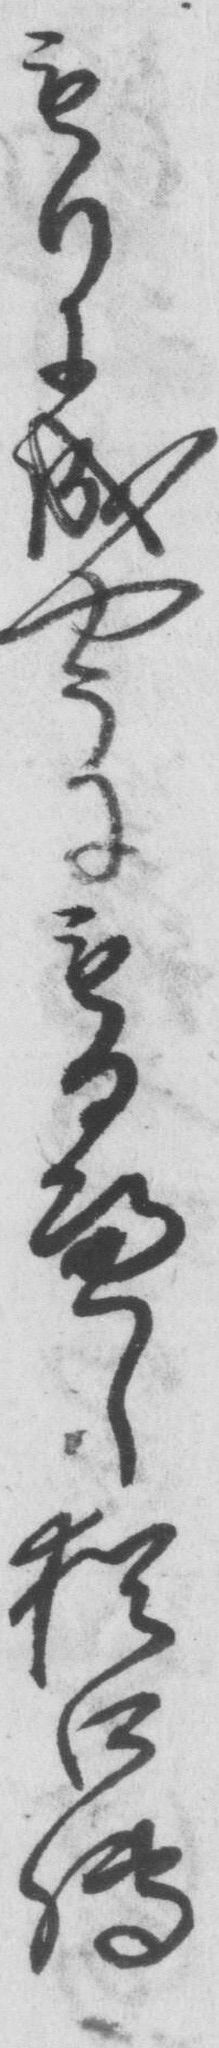もりに成やうにもるへし猶口伝
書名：料理次第
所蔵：大阪府立大学学術情報センター 国文学研究資料館
